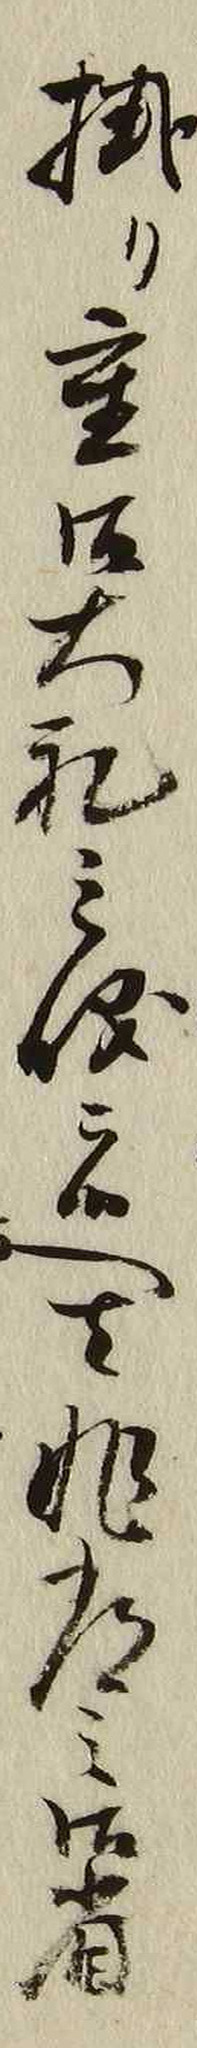掛り重御大礼之儀ニ候へ者非常之御省
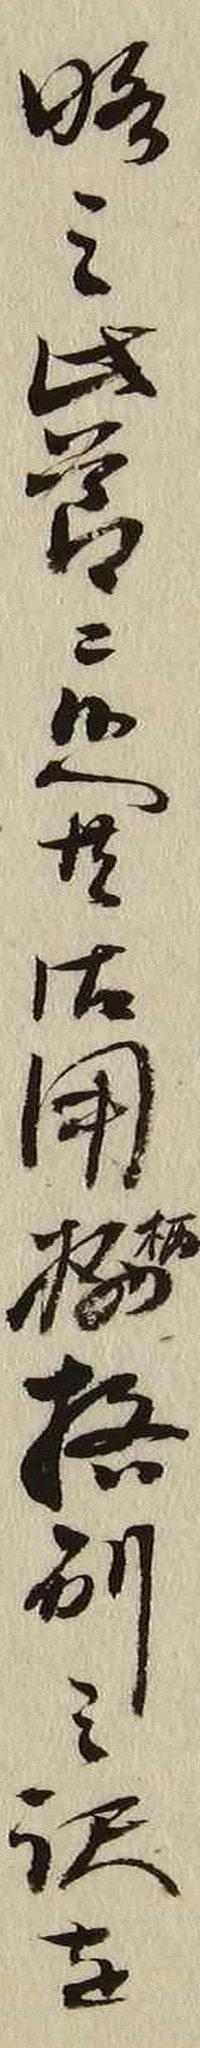略之此節ニ候へ共御用柄格別之訳を
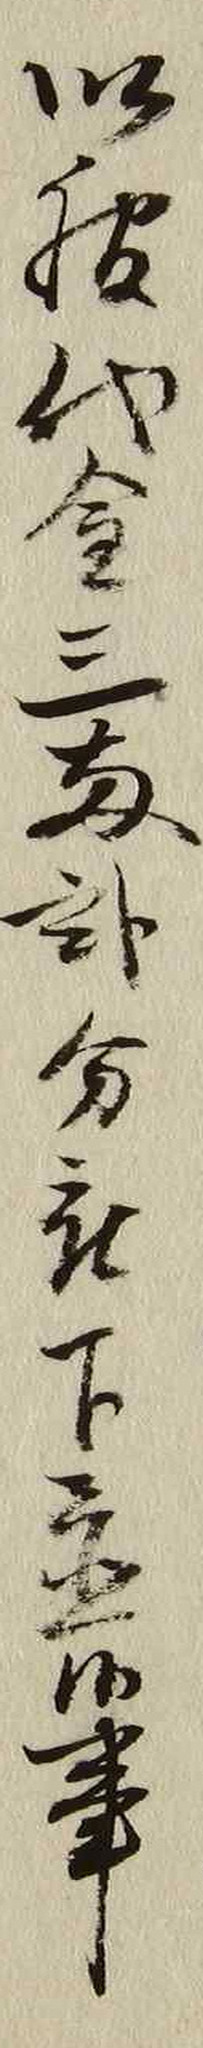以服代金三両弐分被下置候事
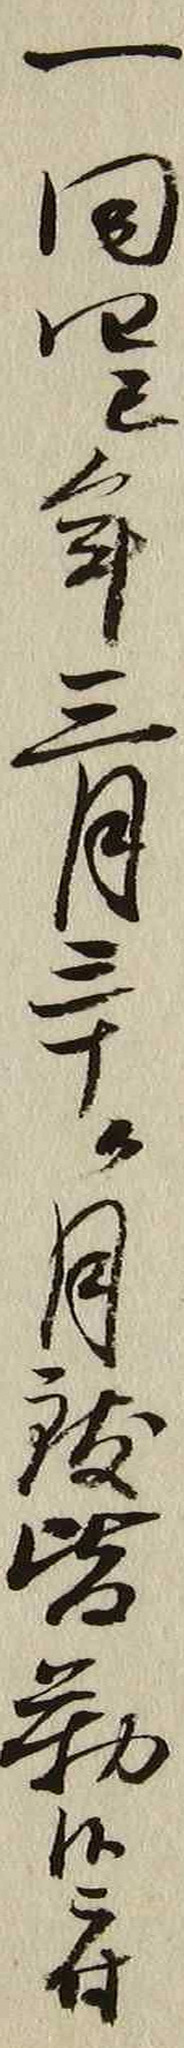一同四巳年三月三十ケ月致皆勤候ニ付
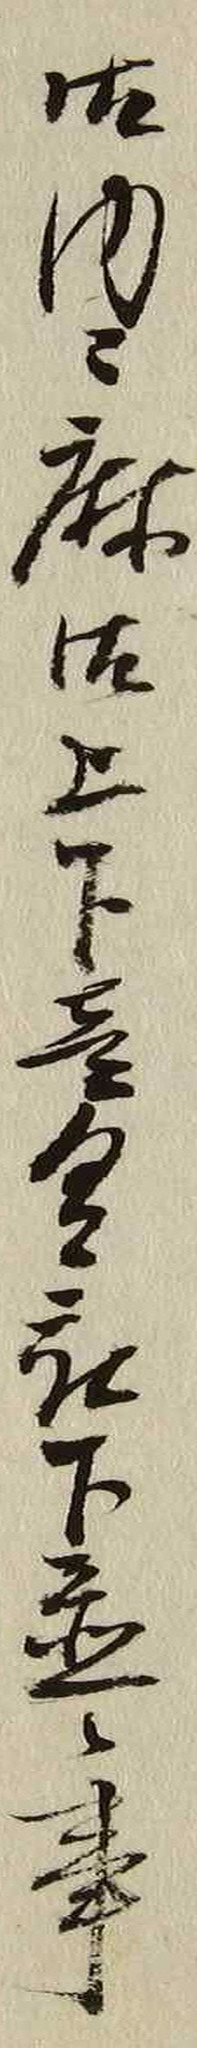御内々麻御上下壱具被下置候事
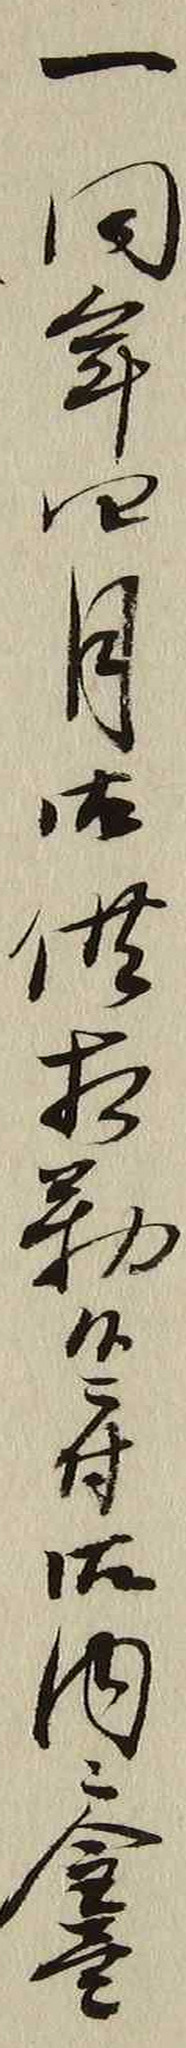一同年四月御供相勤候ニ付御内々金壱
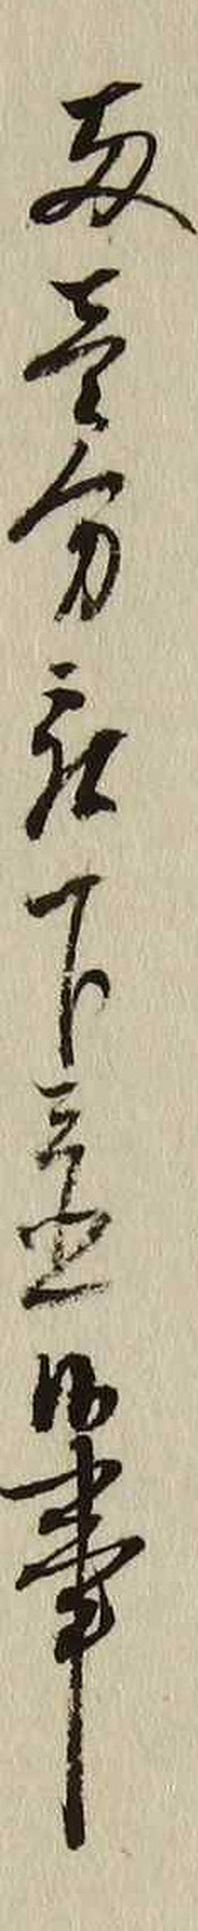両壱分被下置候事
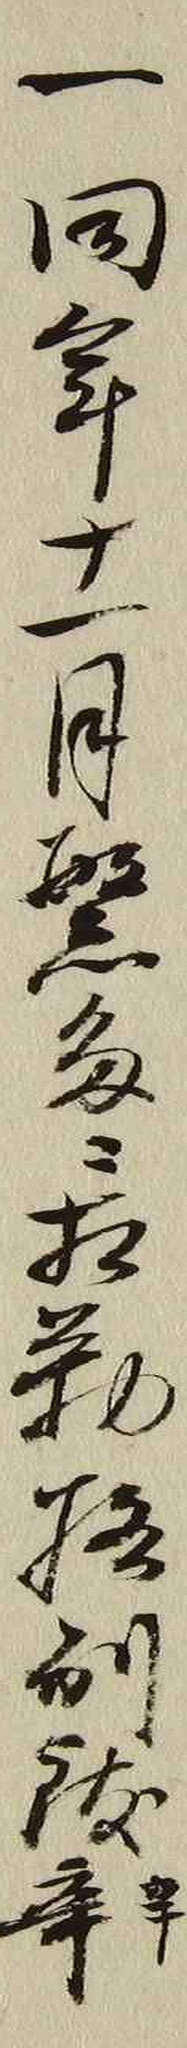一同年十一月繁多ニ相勤格別致辛
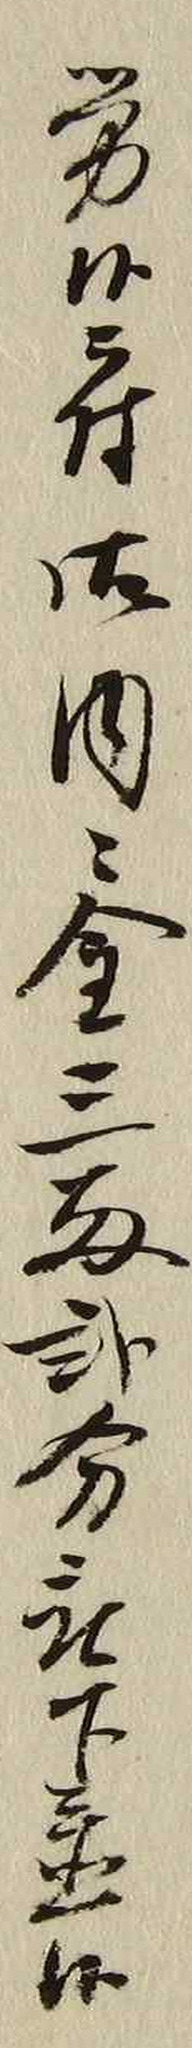労候ニ付御内々金三両弐分被下置候
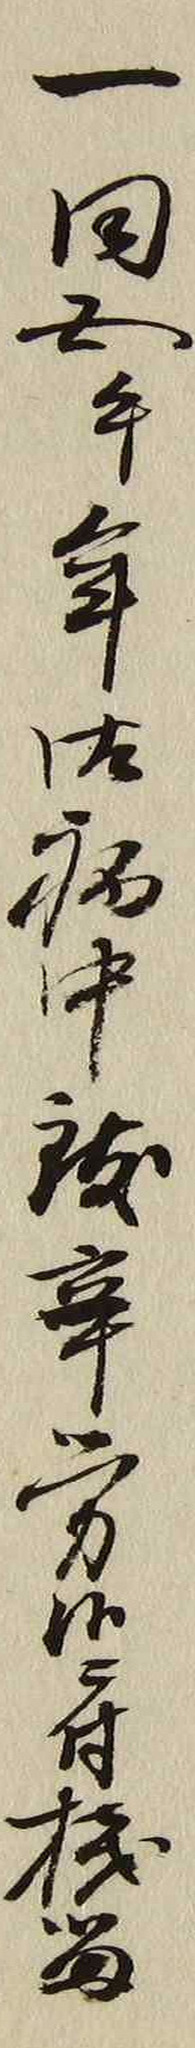一同五午年御病中致辛労候ニ付桟留
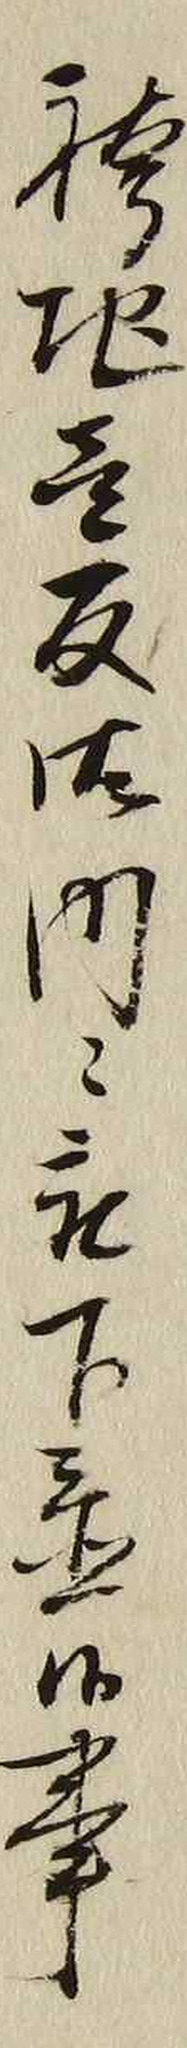袴地壱反御内々被下置候事
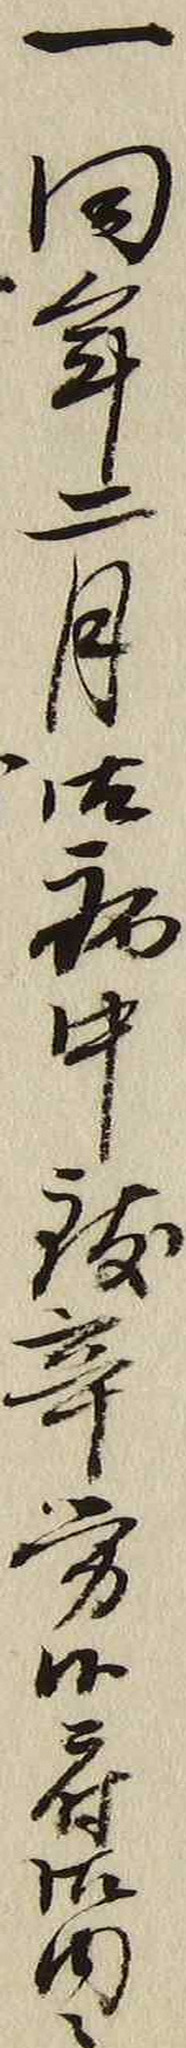一同年二月御病中致辛労候ニ付御内々
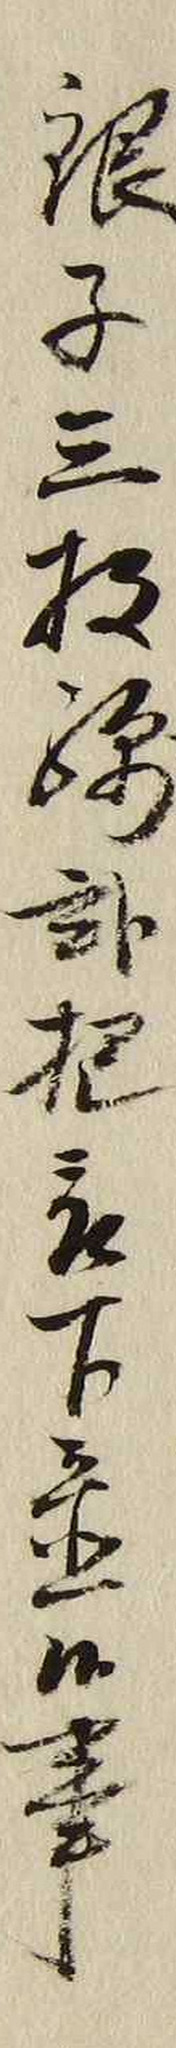銀子三枚綿弐把被下置候事
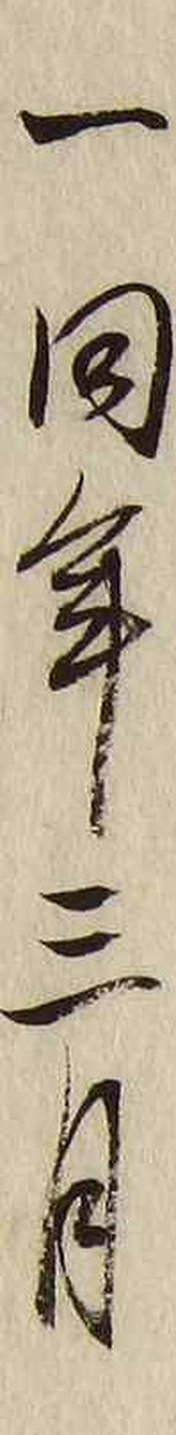一同年三月

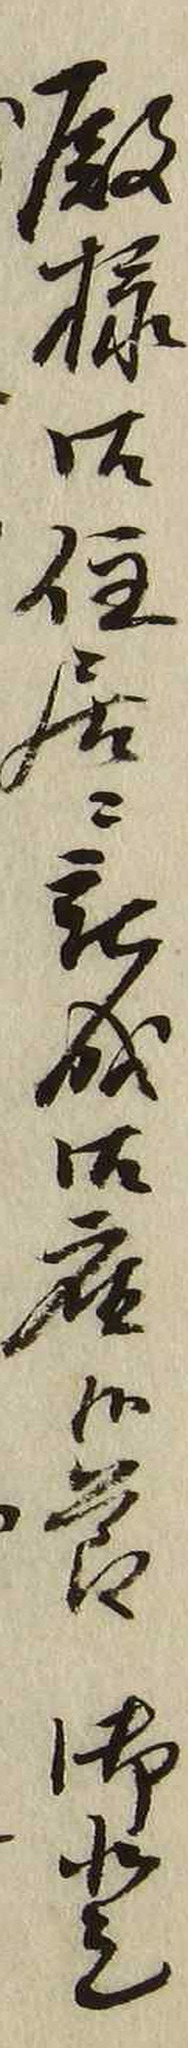殿様御住居ニ被成御座候節御登
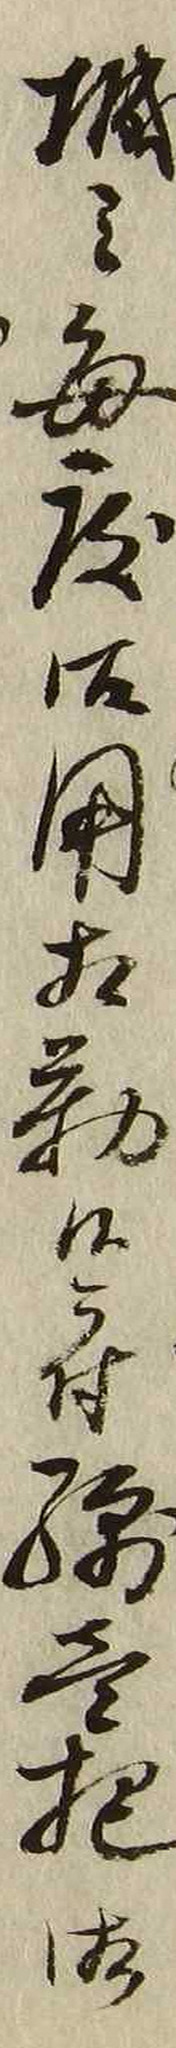城之毎度御用相勤候ニ付綿壱把御
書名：諸士系譜　巻之356　す之部6
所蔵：会津若松市立会津図書館
